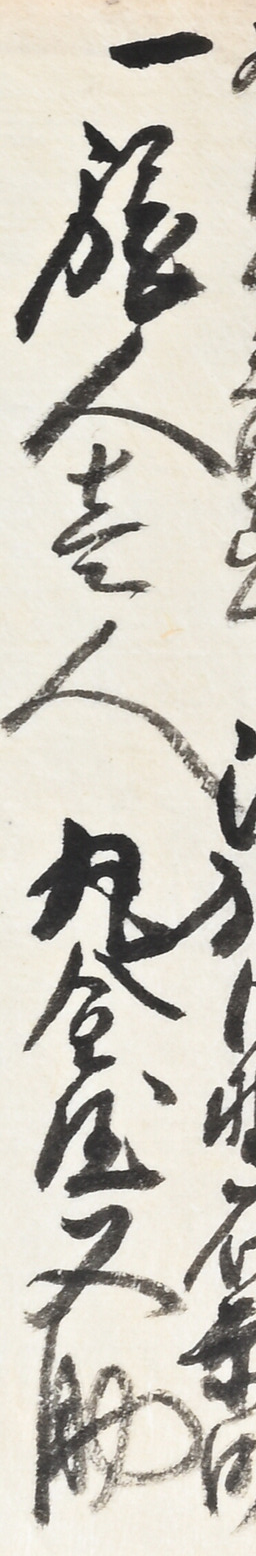一旅人壱人丸金屋又助
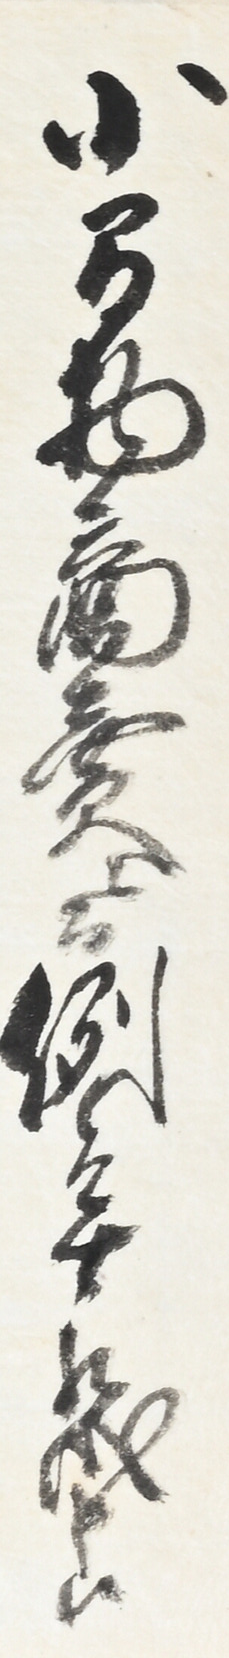小間物商売ニ而例年罷越申候
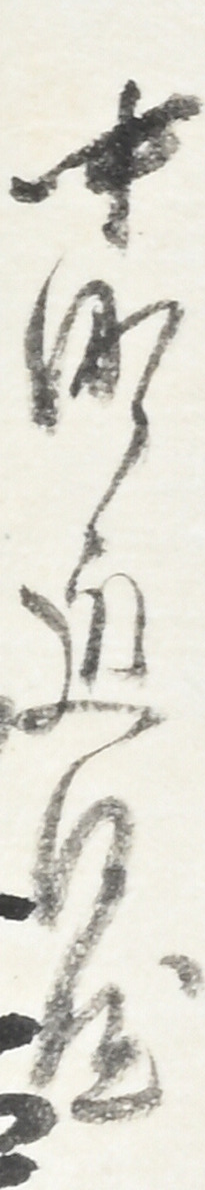中町近江屋
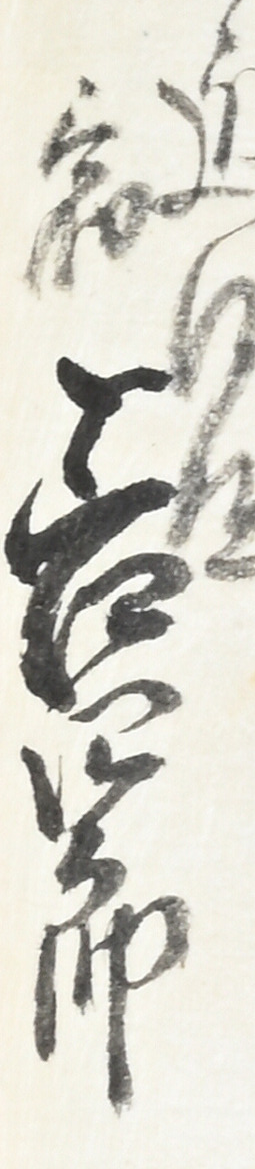宿善四郎
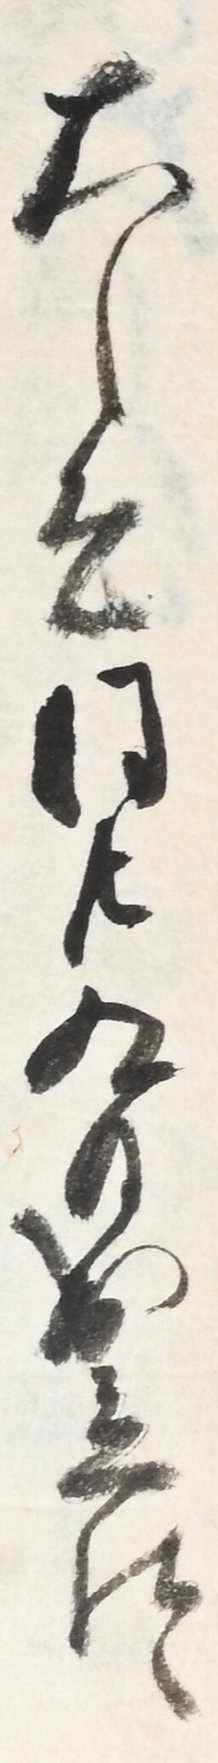右之者同十六日出立仕候
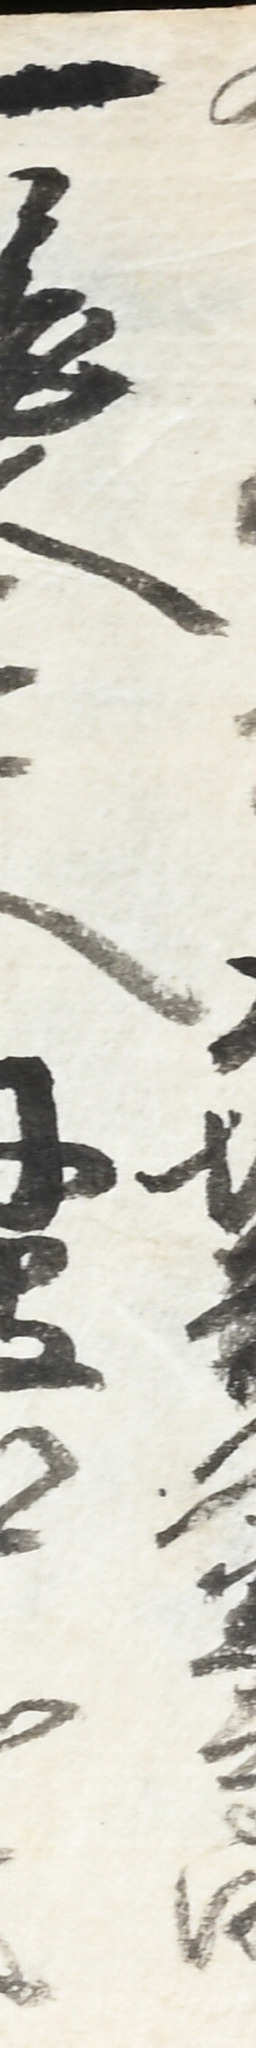一旅人壱人丸金屋又助

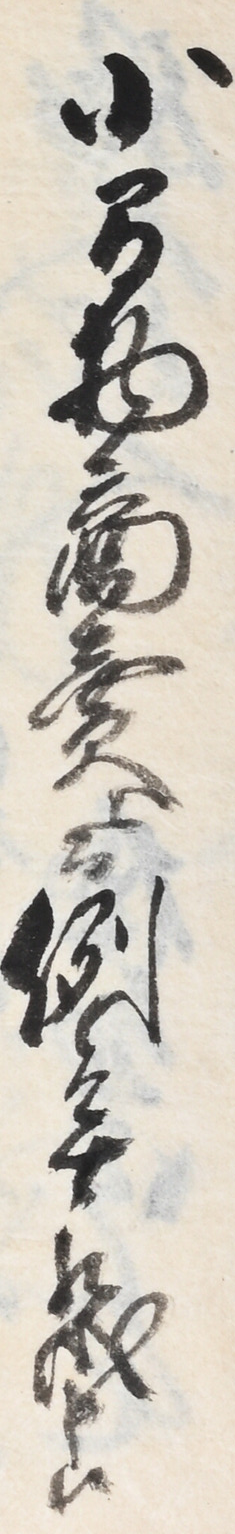小間物商売ニ而例年罷越申候
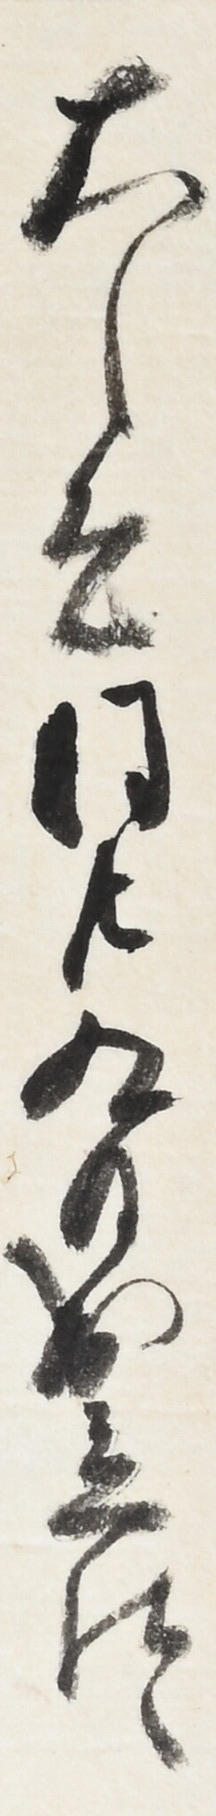右之者同廿九日出立仕候
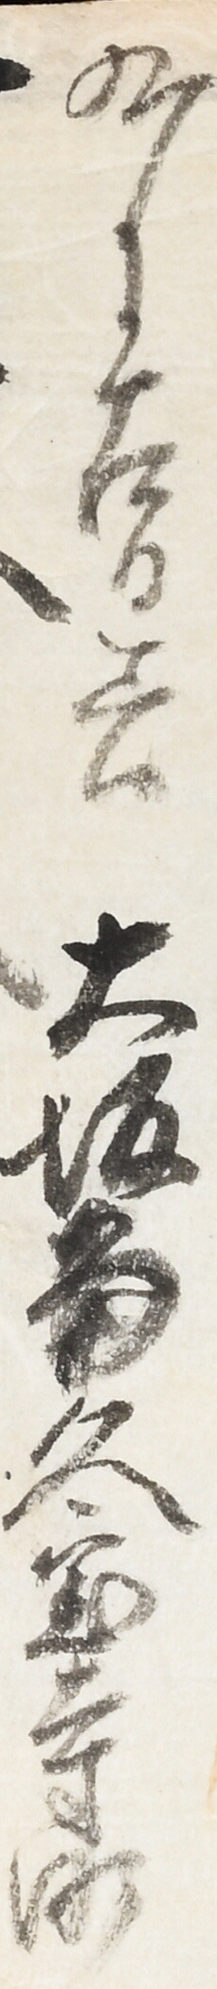九月十四日着大坂南久宝寺町
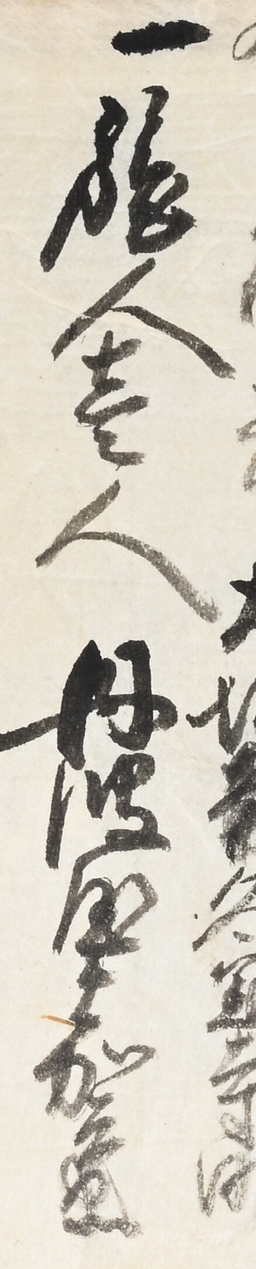一旅人壱人丹波屋嘉兵衛
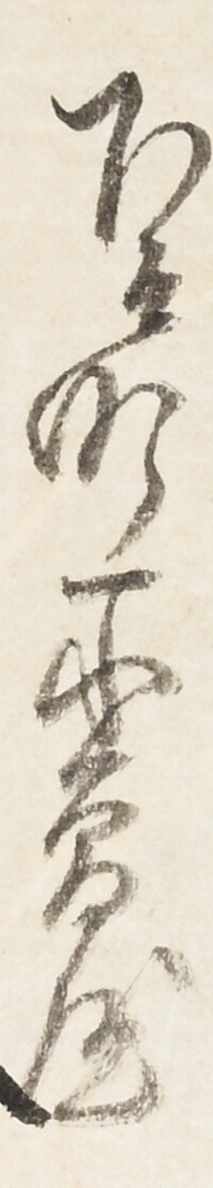下モ町木曽屋
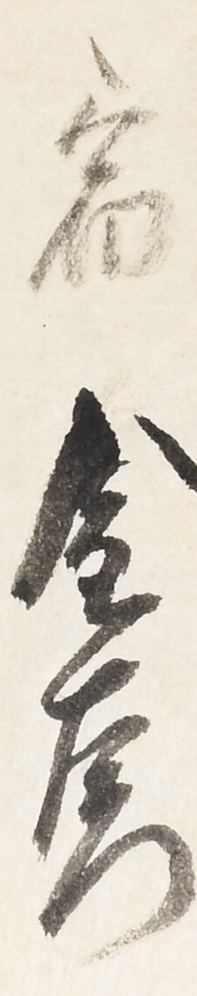宿金右衛門
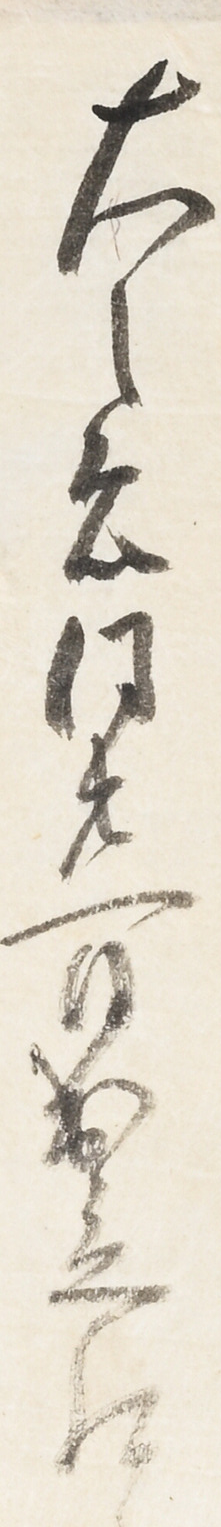右之者同廿一日出立仕候
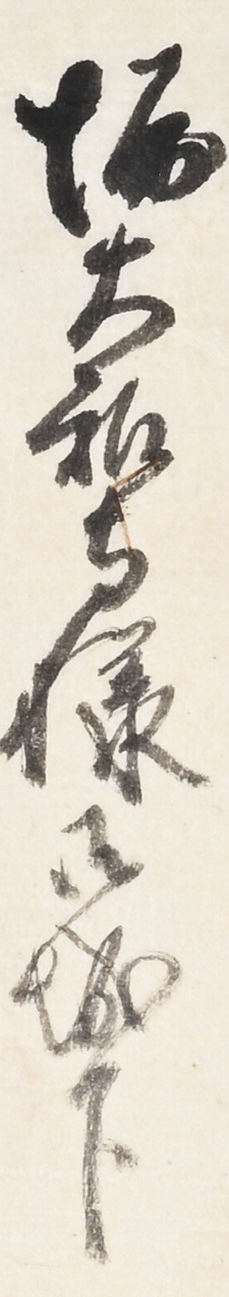堀大和守様御城下
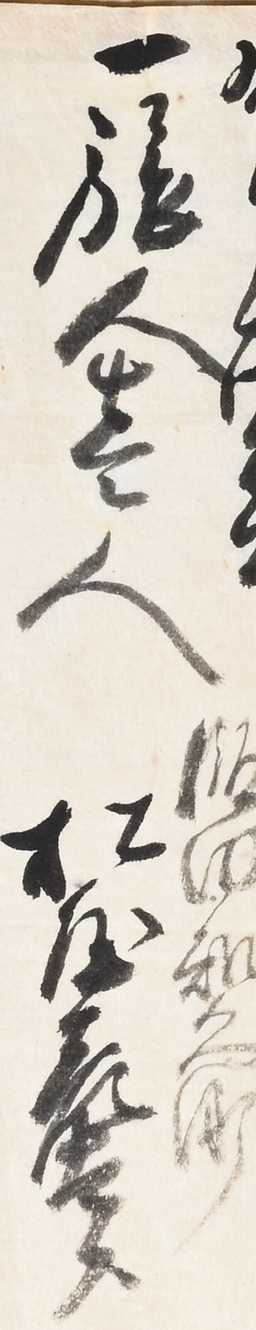一旅人壱人松屋彦太郎
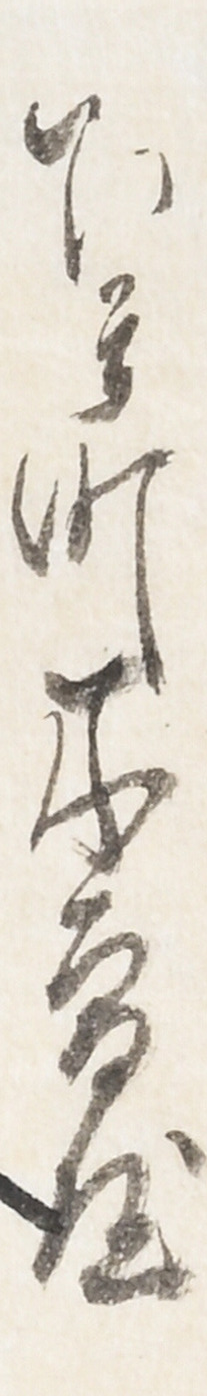下モ町木曽屋
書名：旅人泊控帳
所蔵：伊那市立高遠町図書館・合同会社AMANE
